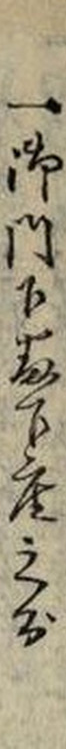一御門所下番下座之分
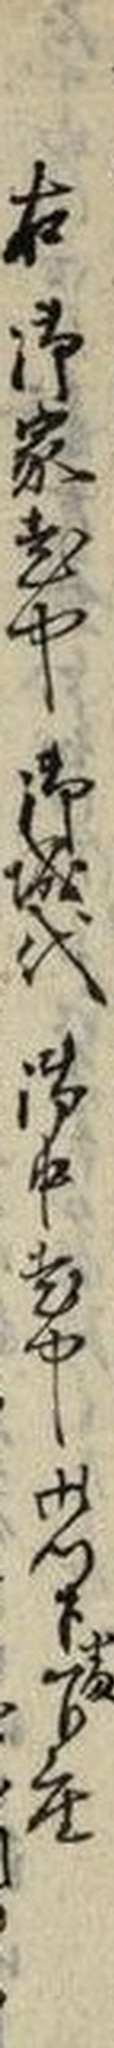右御家老中御城代御中老中御門下番下座
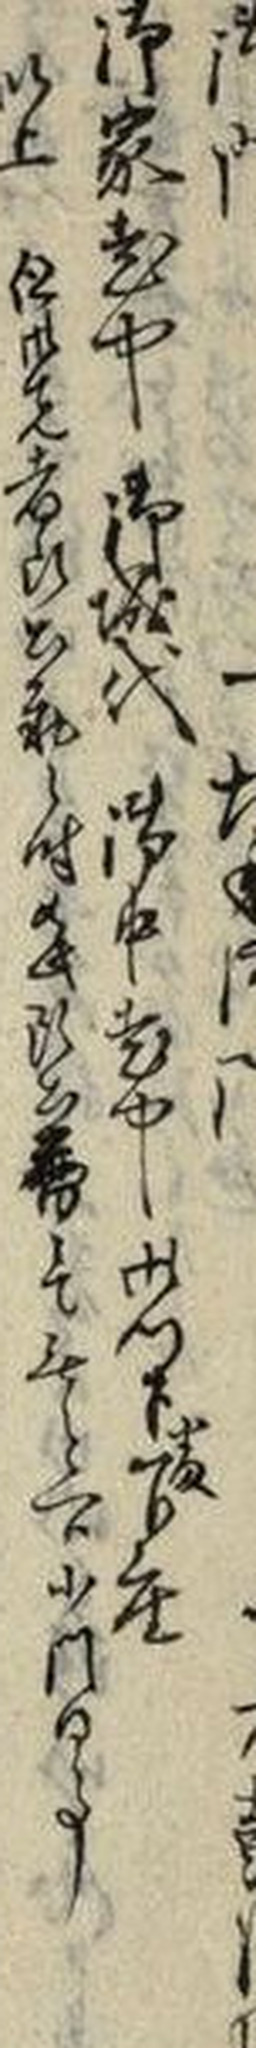以上但御先者物頭出勤之時如此頭出番にて無之候へは小門同事
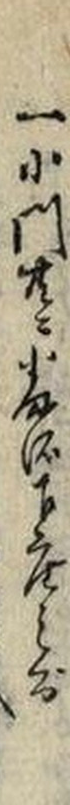一小門共に番所下座之分
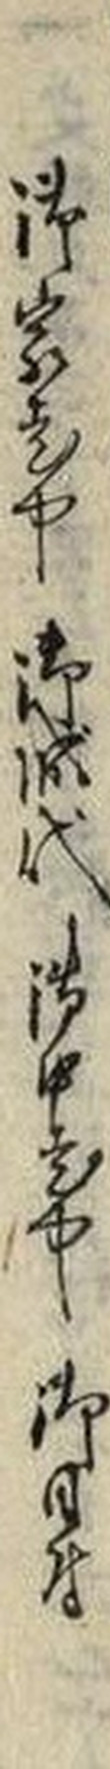御家老中御城代御中老中御目付
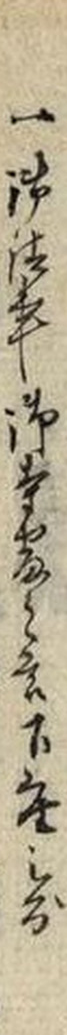一御法事御堂番之節下座之分
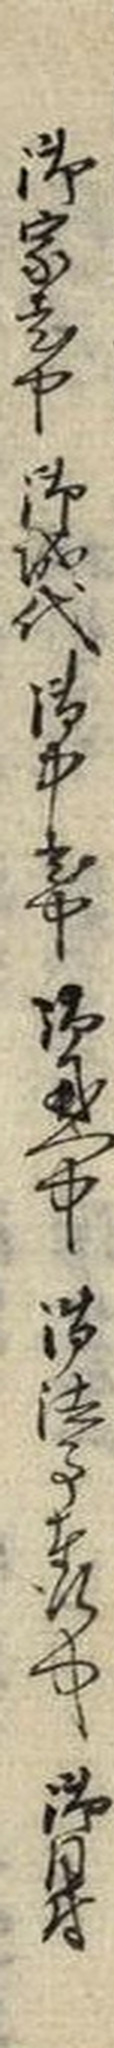御家老中御城代御中老中御用人中御法事奉行中御目付
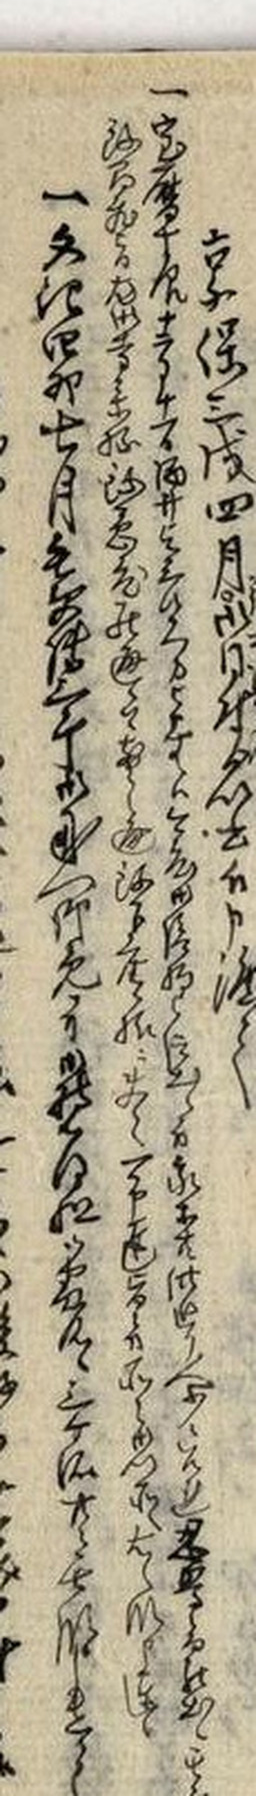致間敷旨尤御寺参抔致急度罷通候はゝ前々之通致下座候様に夫々可申達旨ニ付所々御門所へ右之段申達候
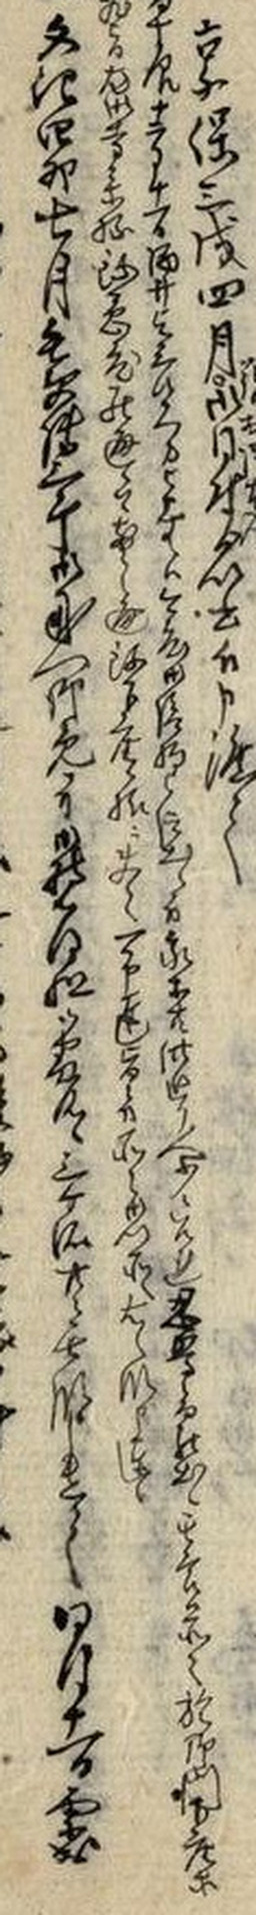致間敷旨尤御寺参抔致急度罷通候はゝ前々之通致下座候様に夫々可申達旨ニ付所々御門所へ右之段申達候
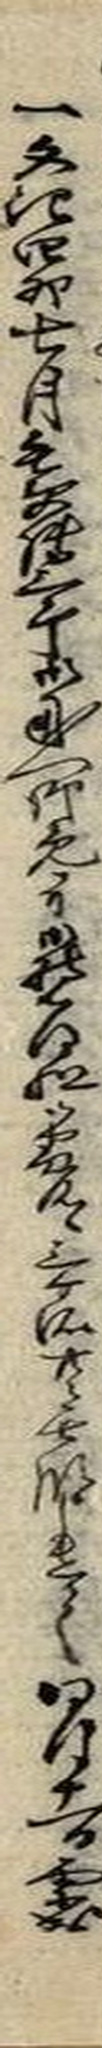一文化四卯七月毛受伝三郎御用人御免に付御持筒組御番所へ三ケ所共に其段申遣之四月十一日雨森
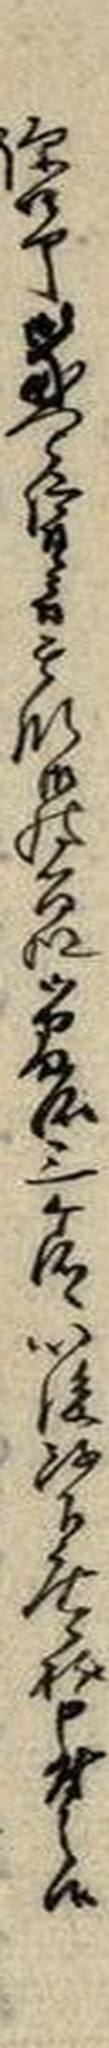源次郎御用人被仰付候に付其段御持筒組御番所三ケ所へ以後致下座候様申付之候
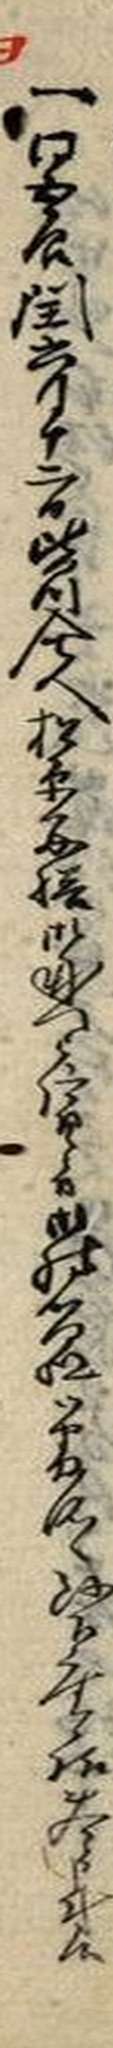一同五辰閏六月十二日皆川舎人松原多膳御用人被仰付候に付御持筒組御番所へ致下座候様夫々申付候

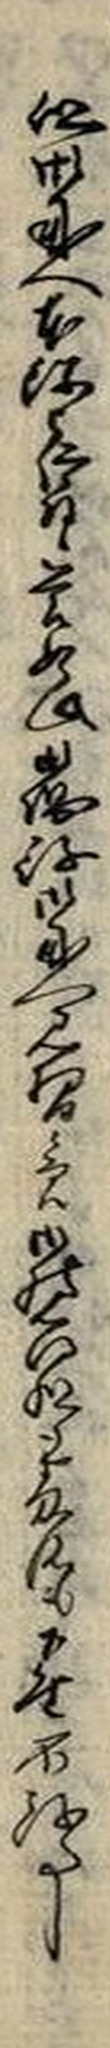但御用人本役被仰付候節如此御側役御用人見習に而は御持筒組御番所も下座不致事
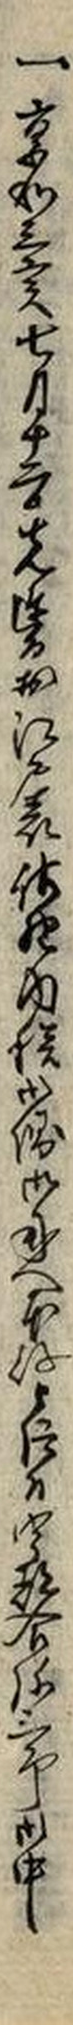一享和三亥七月十二日先達而於江戸表佐野内膳御側御用人本役被仰付候宇都合弥三郎御中
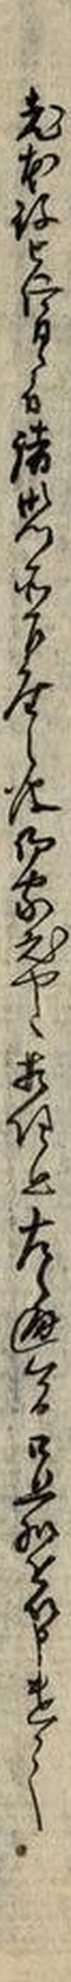老本役被仰付候ニ付諸御門所下座之儀御家老中へ相伺候上左之通今日口上扣を以申遣之
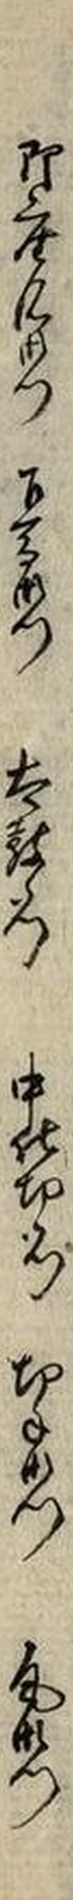御座所御門下馬御門太鼓御門中仕切御門切手御門瓦御門
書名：御門御櫓之部
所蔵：福井県文書館 Fukui Prefectural Archives
